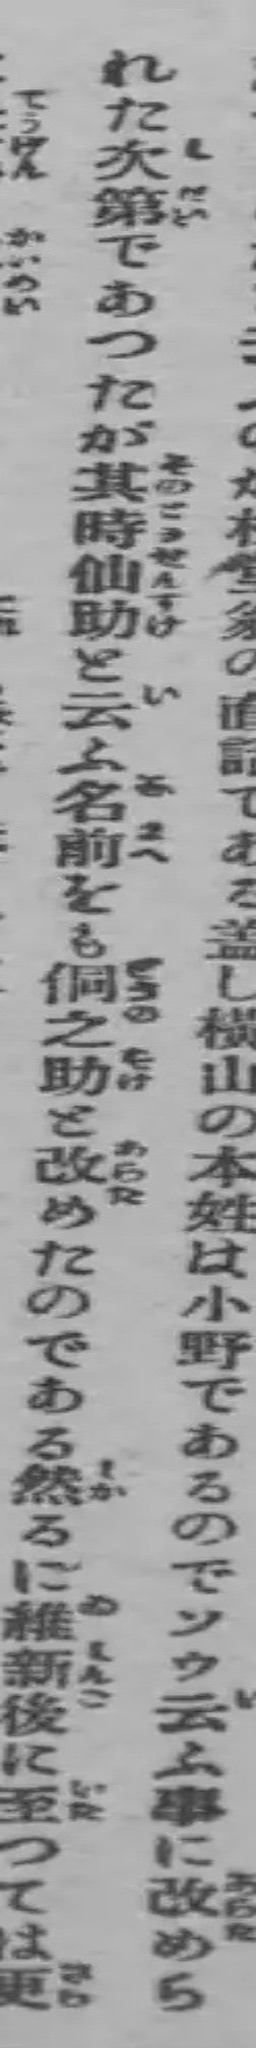れた次第であつたが其時仙助と云ふ名前をも侗之助と改めたのである然るに維新後に至つては更
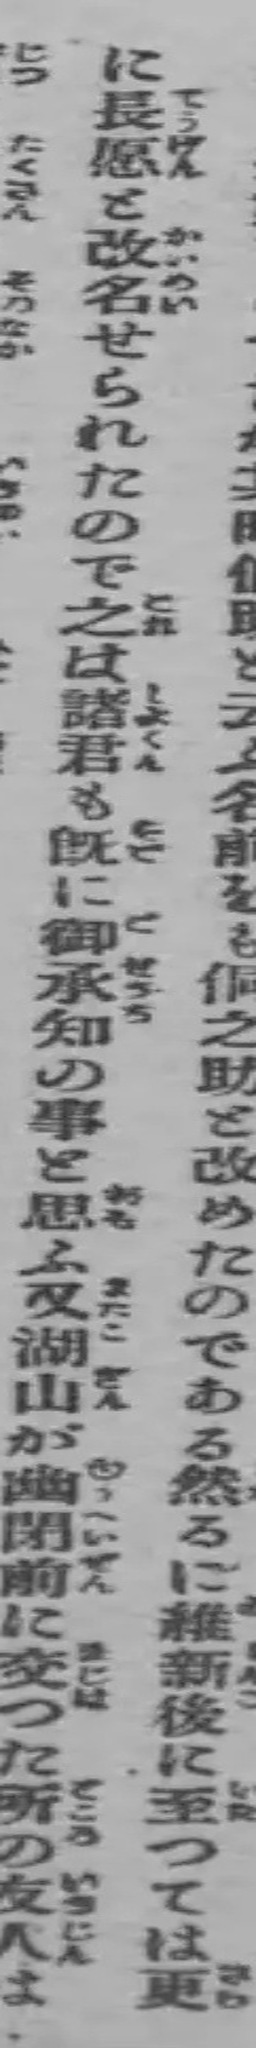に長愿と改名せられたので之は諸君も既に御承知の事と思ふ又湖山が幽閉前に交つた所の友人は
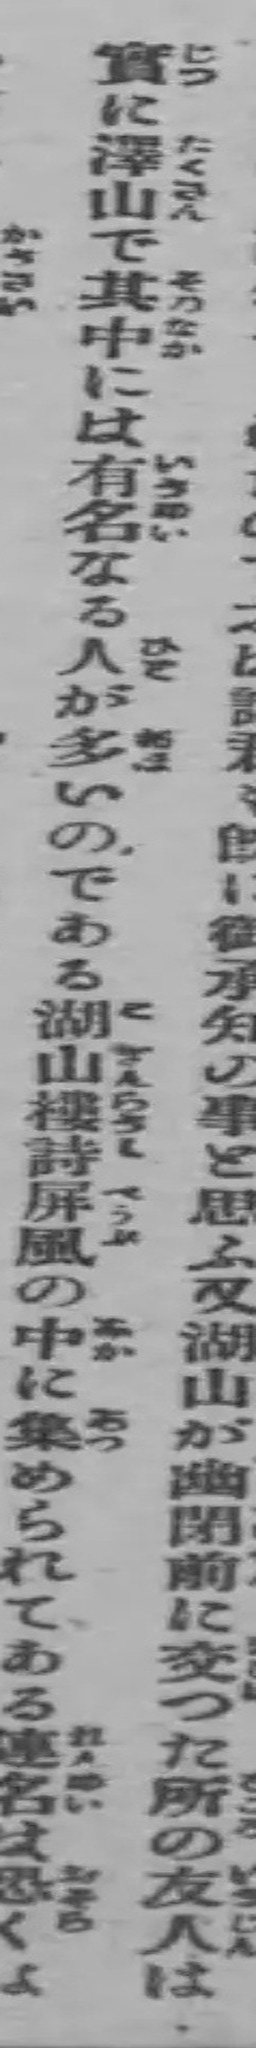実に沢山で其中には有名なる人が多いのである湖山楼詩屏風の中に集められてある連名は恐くは
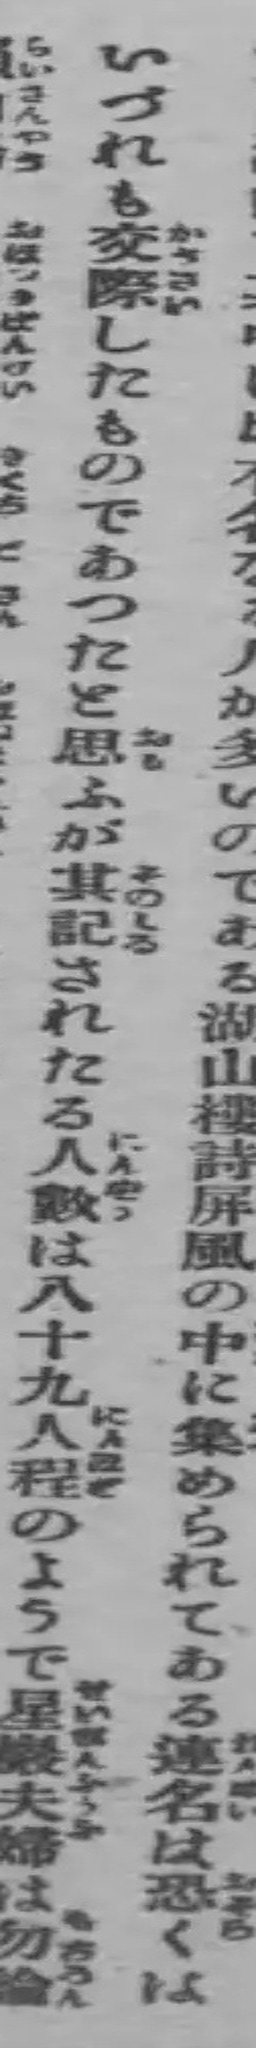いづれも交際したものであつたと思ふが其記されたる人数は八十九人程のようで星嚴夫婦は勿論
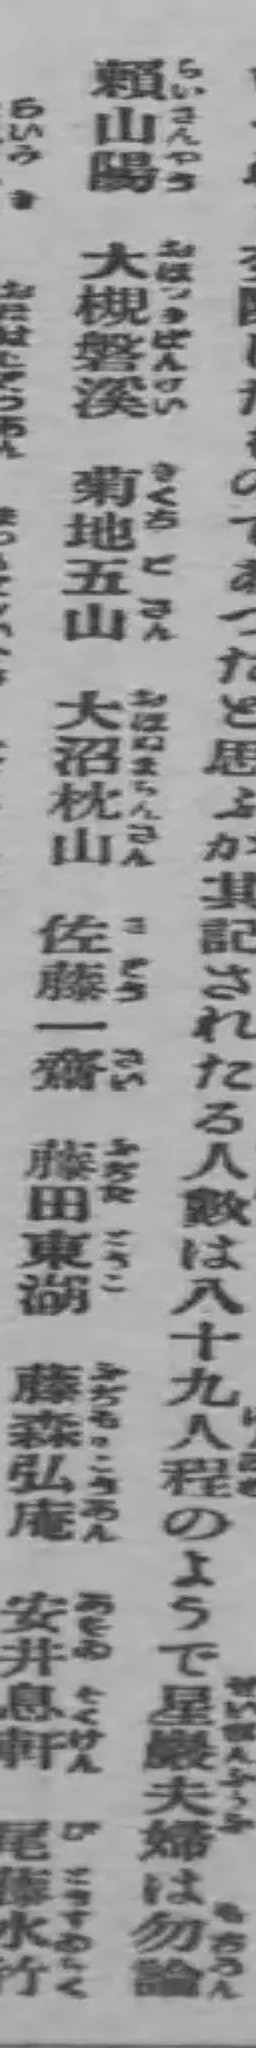頼山陽大槻盤渓菊地五山大沼枕山佐藤一斎藤田東湖藤森弘庵安井息軒尾藤水竹
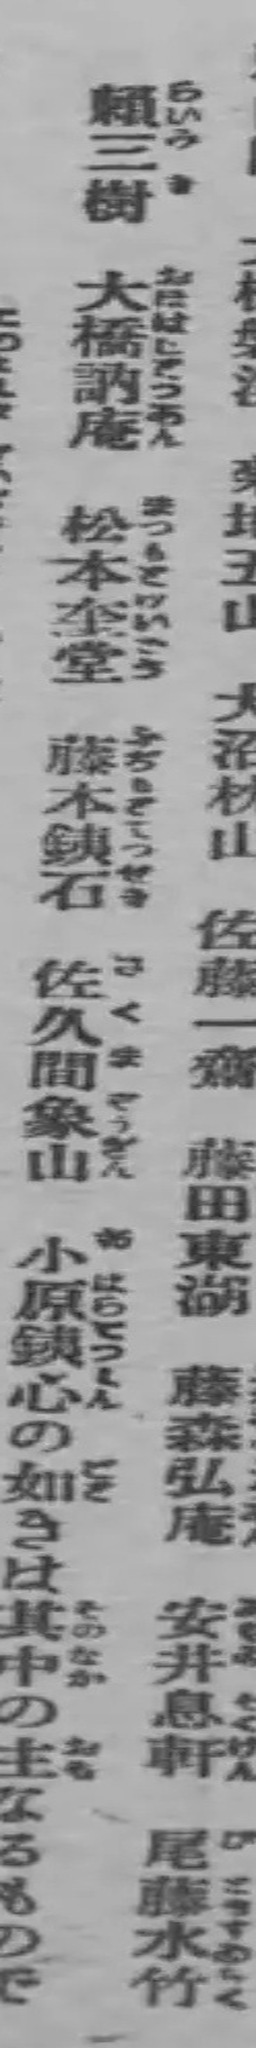頼三樹大橋訥庵松本奎堂藤本銕石佐久間象山小原銕心の如きは其中の主なるもので
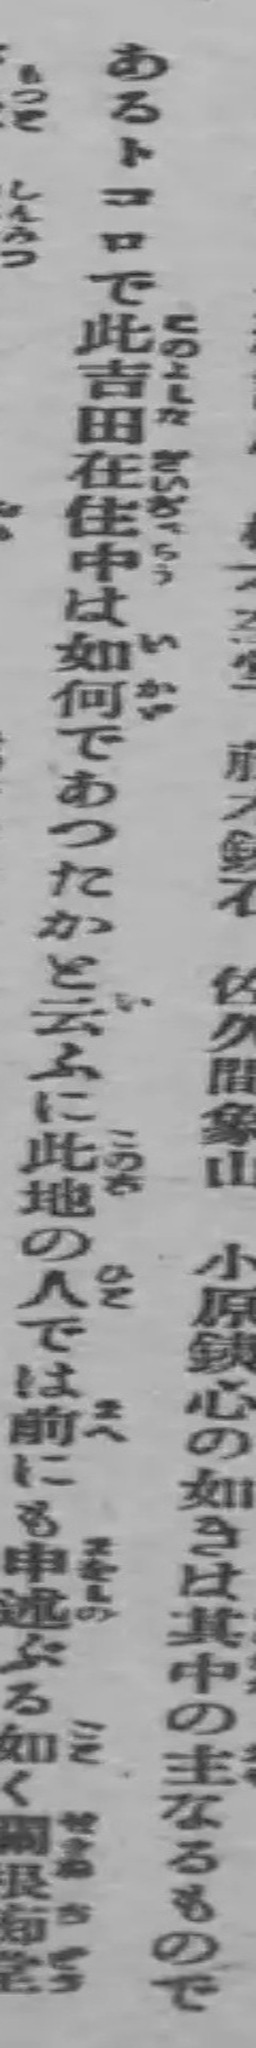あるトコロで此吉田在住中は如何であつたかと云ふに此地の人では前にも申述ぶる如く関根痴堂
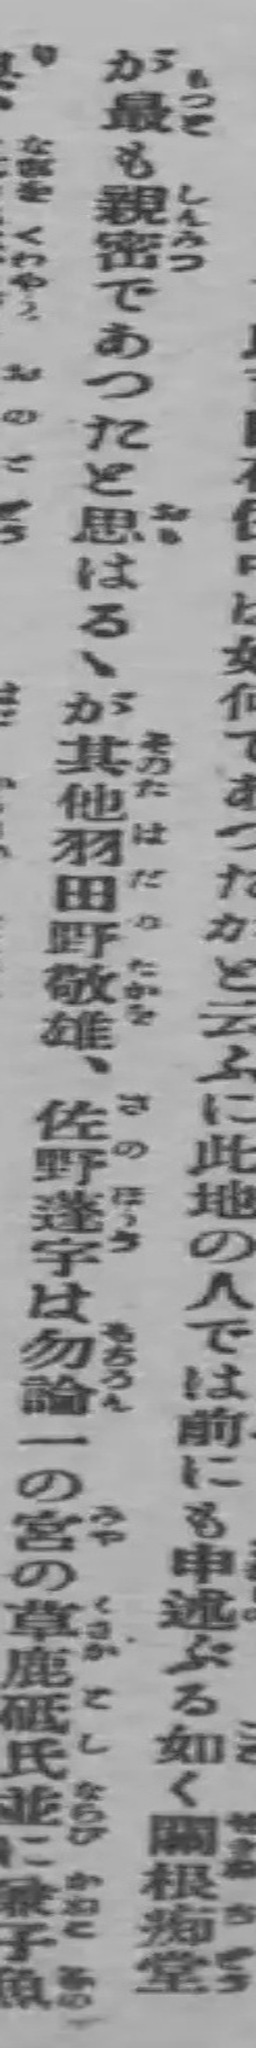が最も親であつたと思はるゝが其他羽田野敬雄、佐野蓬宇は勿論一の宮の草鹿砥氏並に兼子魚
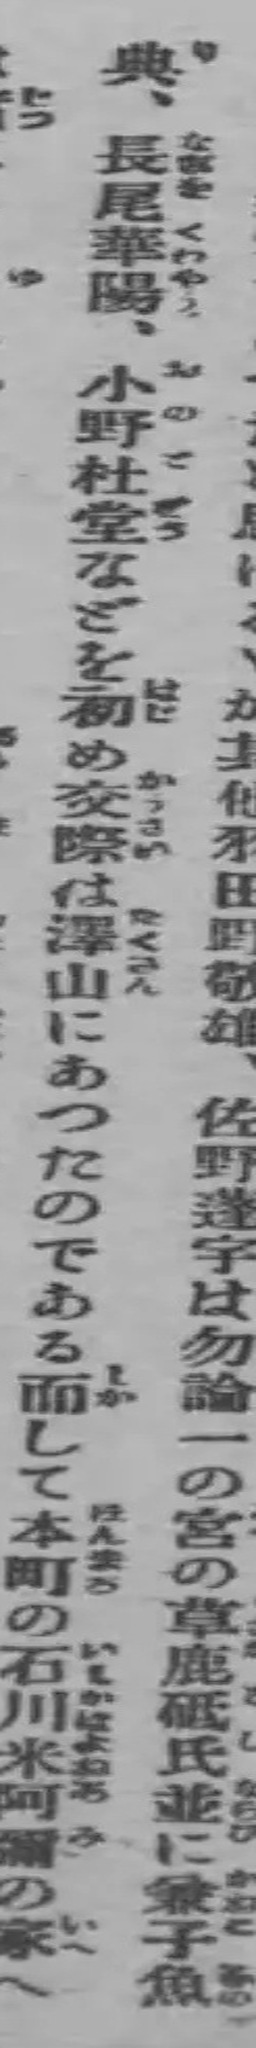典、長尾華陽、小野杜堂などを初め交際は沢山にあつたのである而して本町の石川米阿彌の家へ
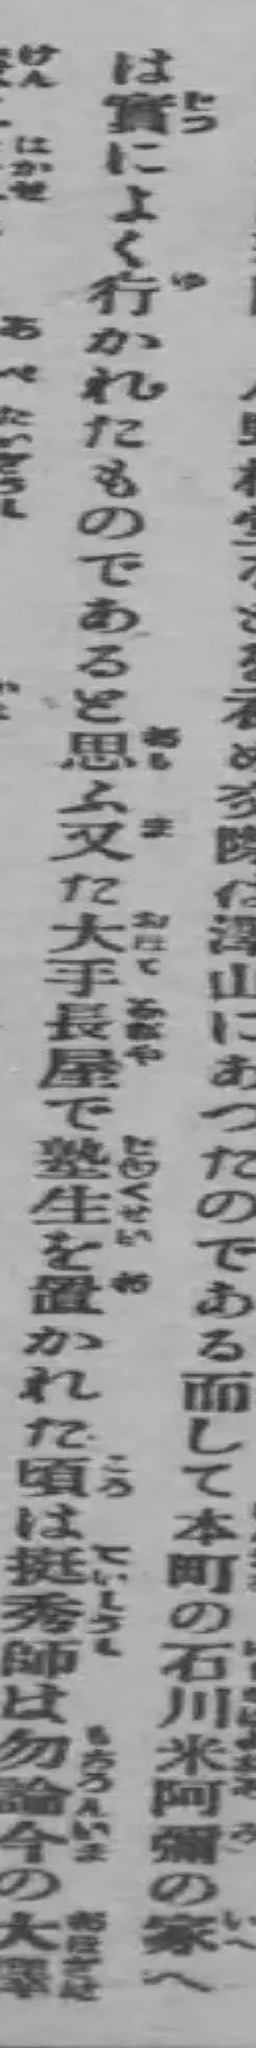は実によく行かれたものであると思ふ又た大手長屋で塾生を置かれた頃は挺秀師は勿論今の大澤
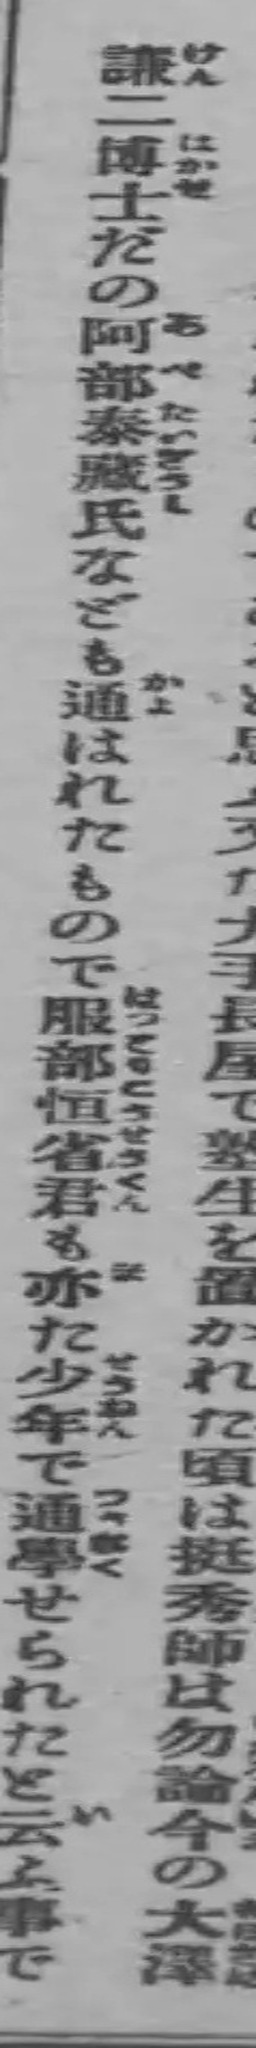謙二博士だの阿部泰蔵氏なども通はれたもので服部恒省君も亦た少年で通学せられたと云ふ事で
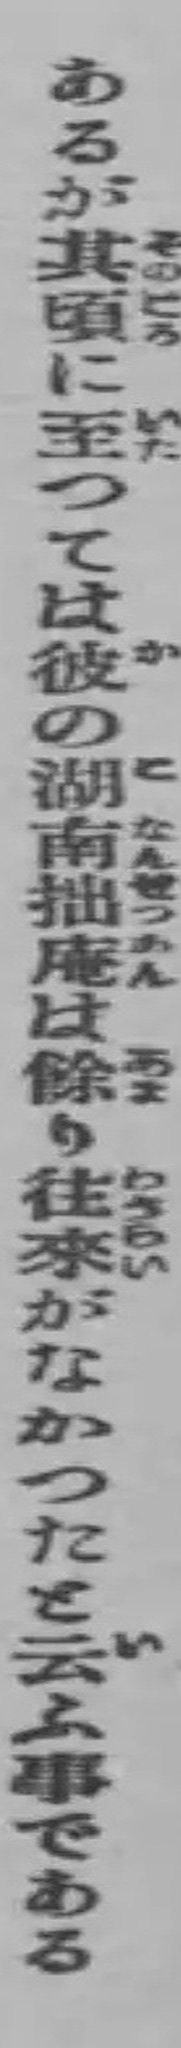あるが其頃に至つては彼の湖南拙庵は余り往来がなかつたと云ふ事である
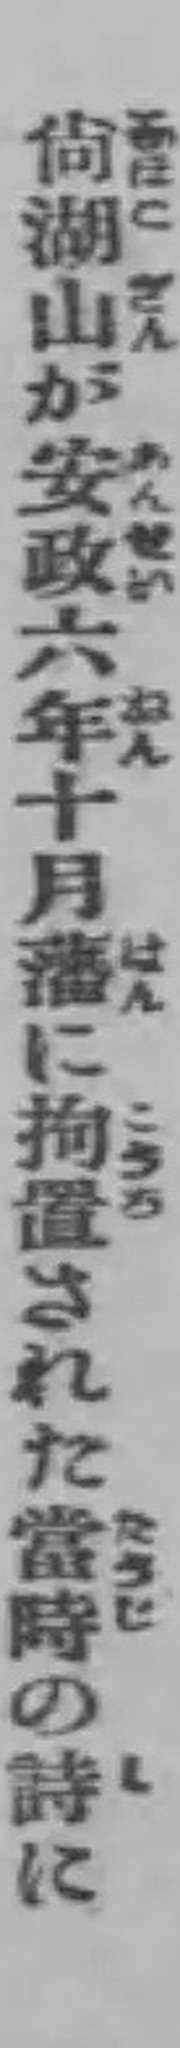尚湖山が安政六年十月藩に拘置された当時の詩に
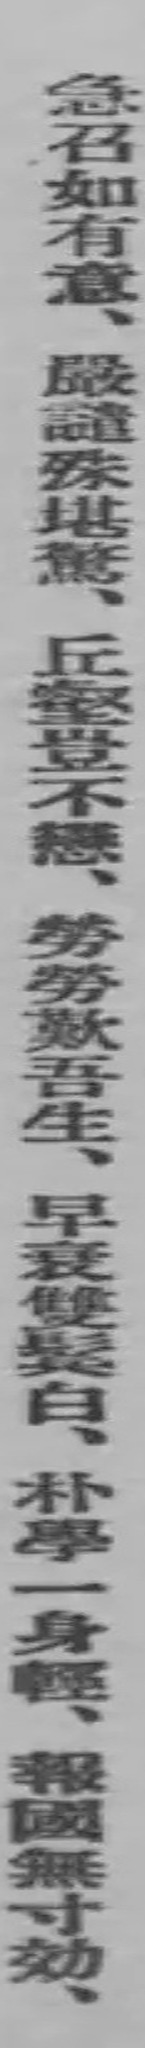急召如有意、嚴譴殊堪驚、丘壑豈不変、労労歎吾生、早衰双鬂白、朴学一身軽、報国無寸効、
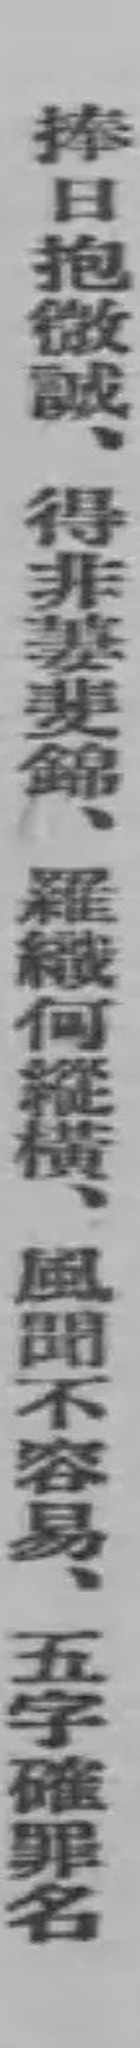捧日抱微誠、得非萋斐錦、羅織何縦横、風聞不容易、五字確罪名
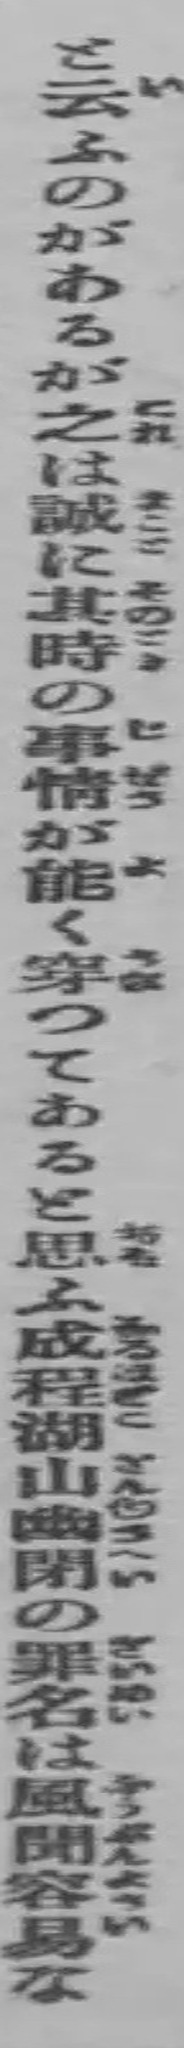と云ふのがあるが之は誠に其時の事情が能く穿つてあると思ふ成程湖山幽閉の罪名は風聞容易な
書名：豊橋市史談
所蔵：国立国会図書館 National Diet Library, JAPAN
